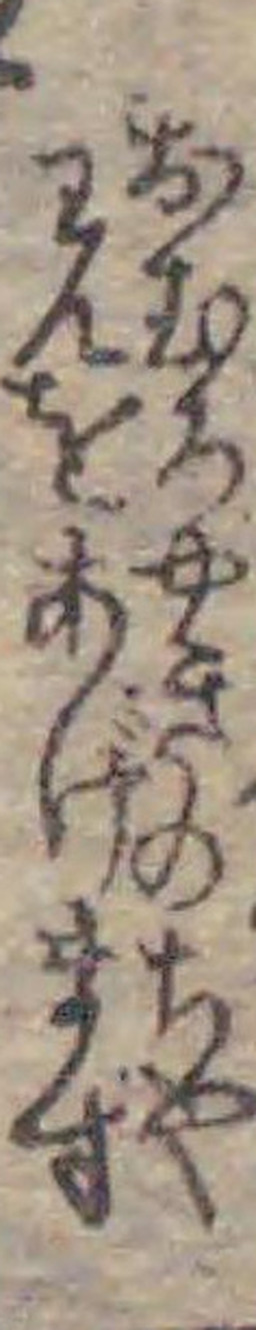わんをあげます
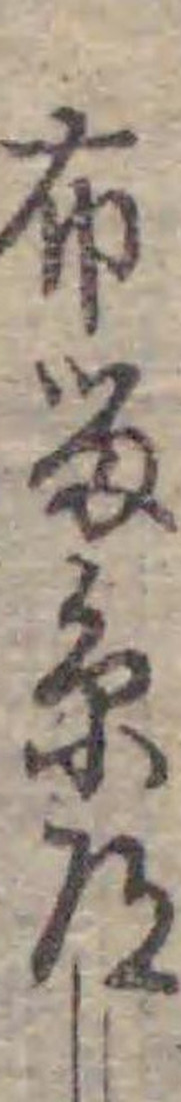布留糸道
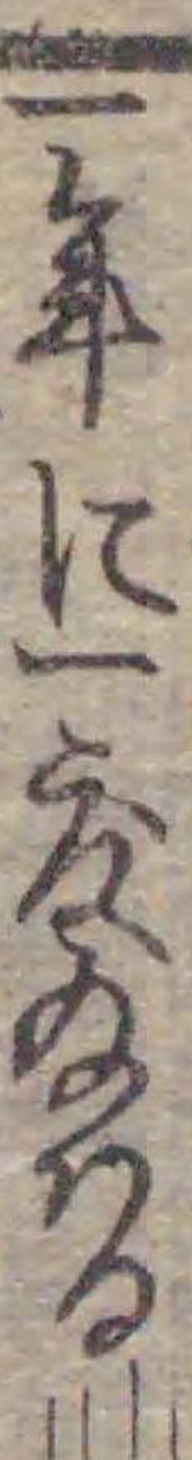一年に一度給はる
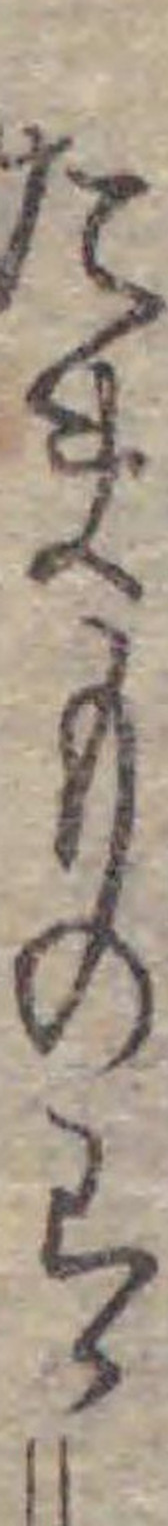たまものは
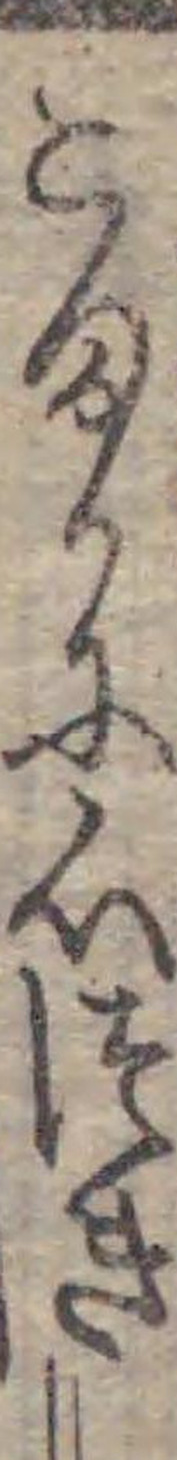こまかに心つきし
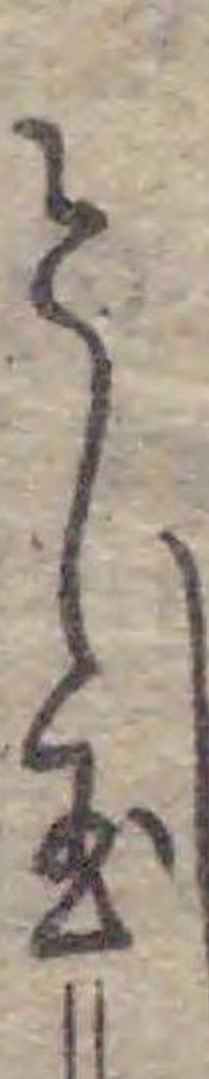とし玉
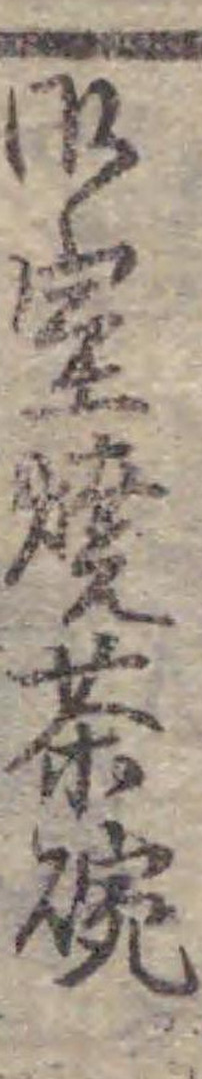御室焼茶碗
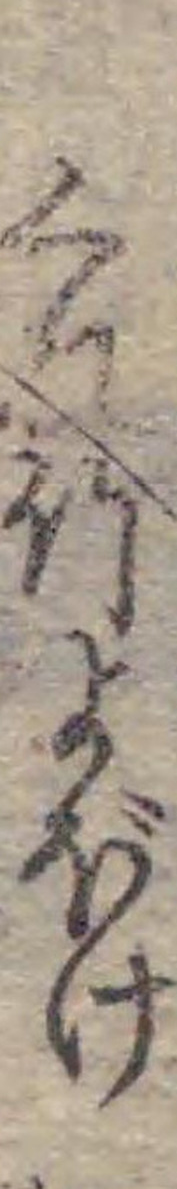くれ武よぼけ
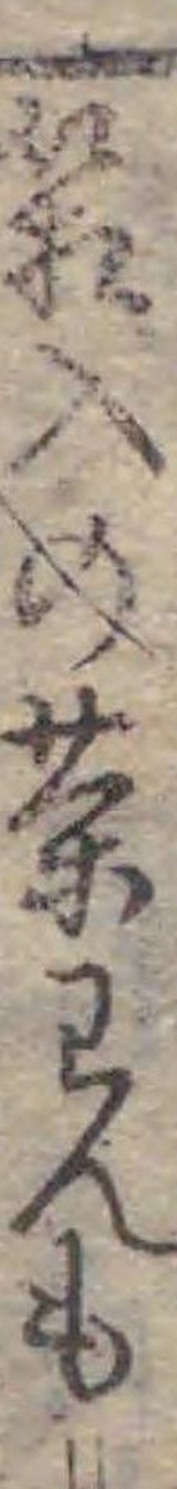箱入の茶わんも
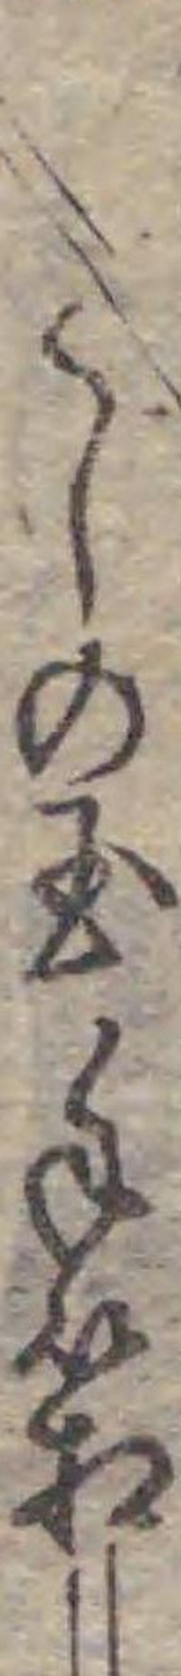としの玉手箱
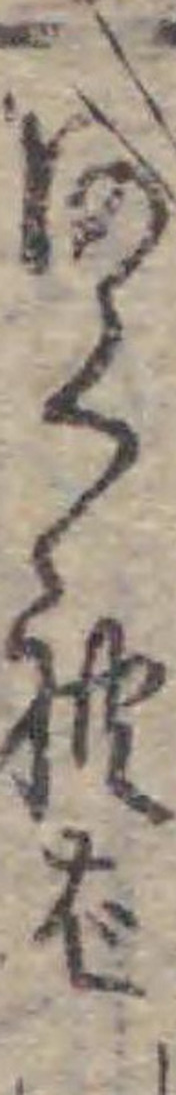あくれば
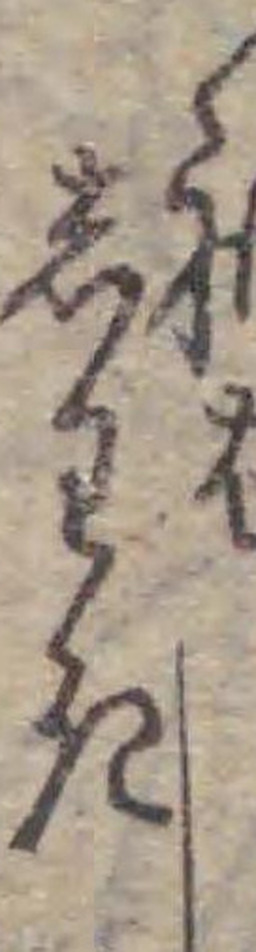しわき
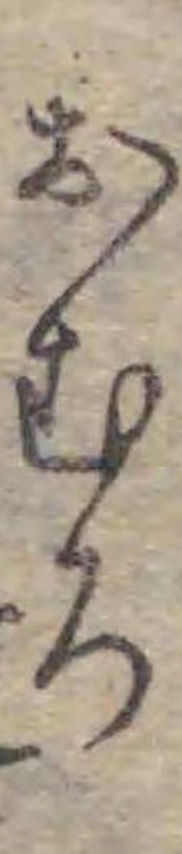おむろ
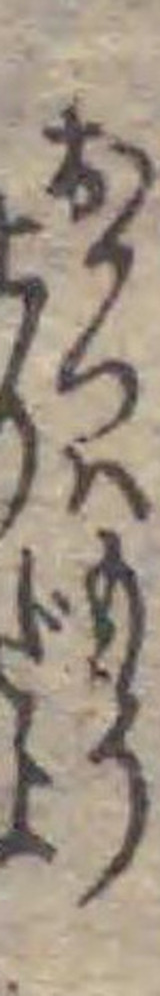おかつはもう
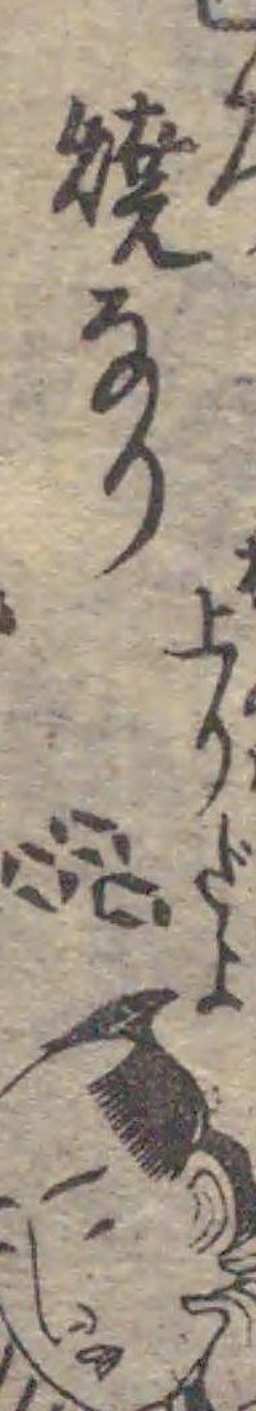焼なり
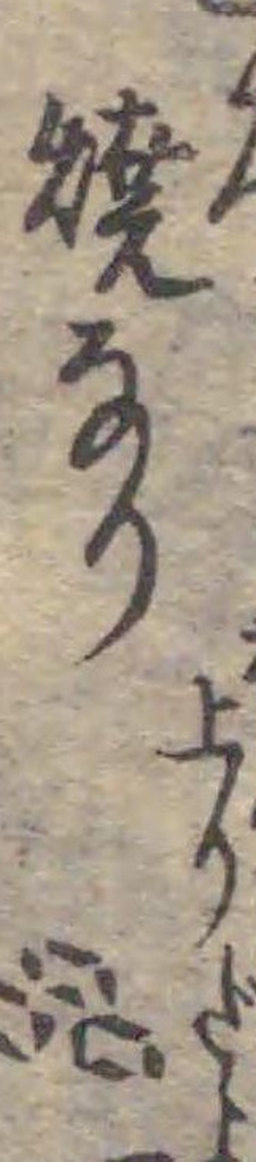焼なり
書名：年始御礼帳 : 3巻
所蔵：国立国会図書館 National Diet Library, JAPAN
